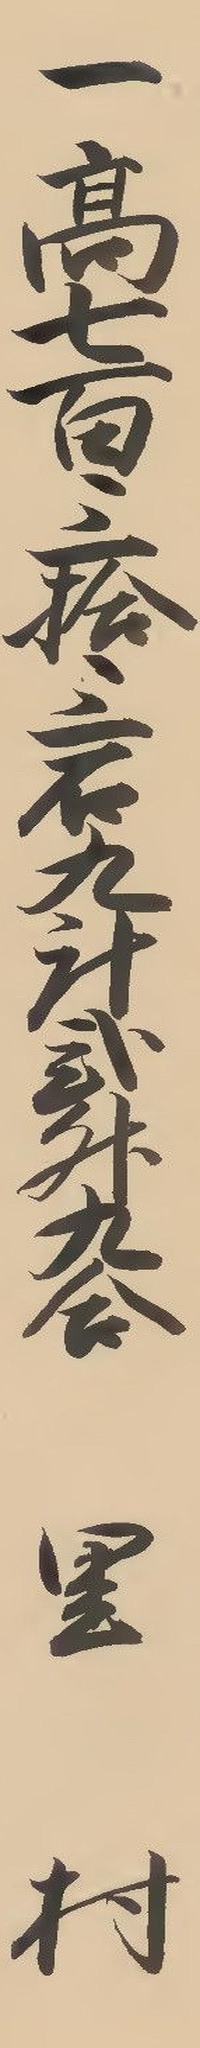一高七百三拾三石九斗弐升九合里村
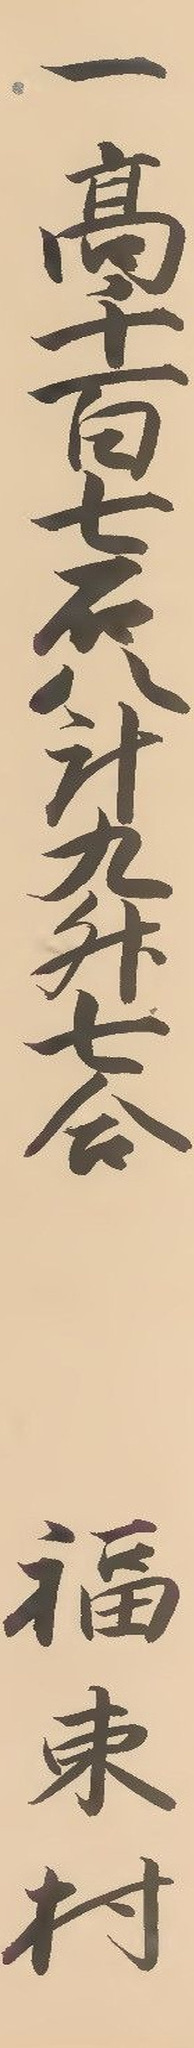一高千百七石八斗九升七合福束村
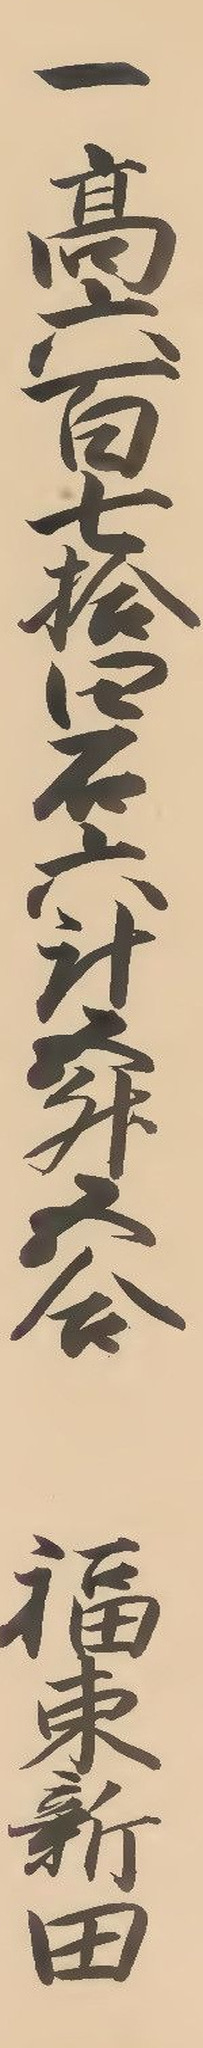一高六百七拾四石六斗五升五合福束新田
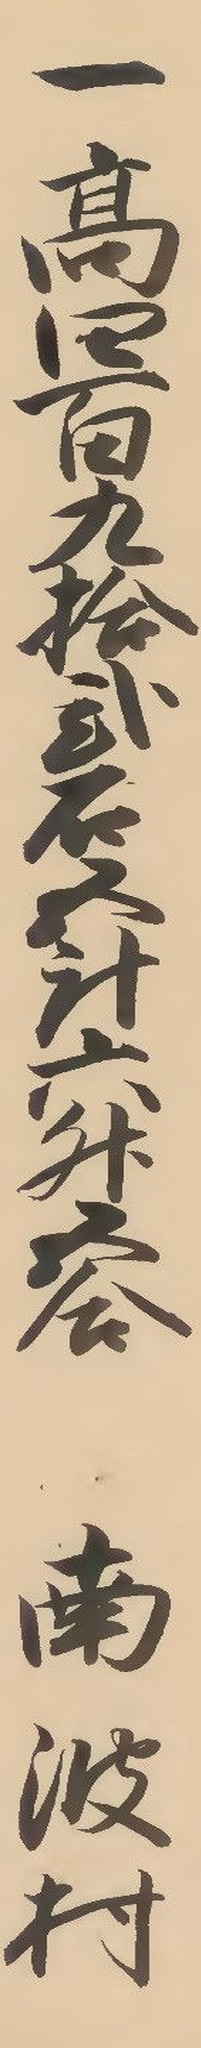一高四百九拾弐石五斗六升五合南波村
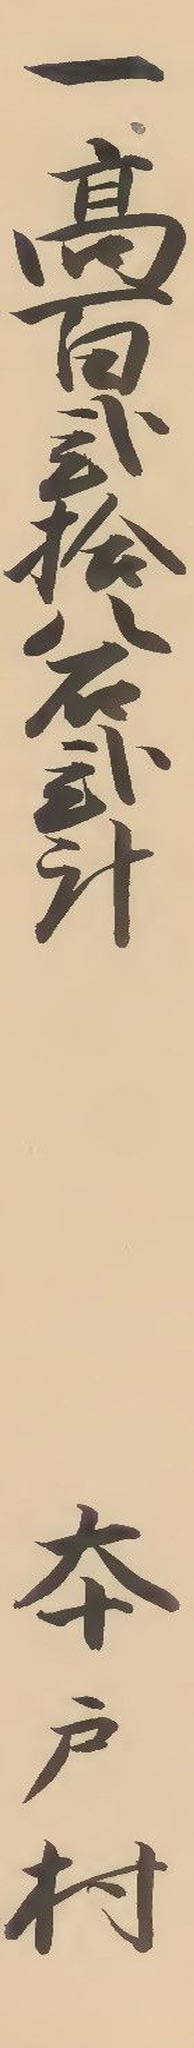一高百弐拾八石弐斗本戸村

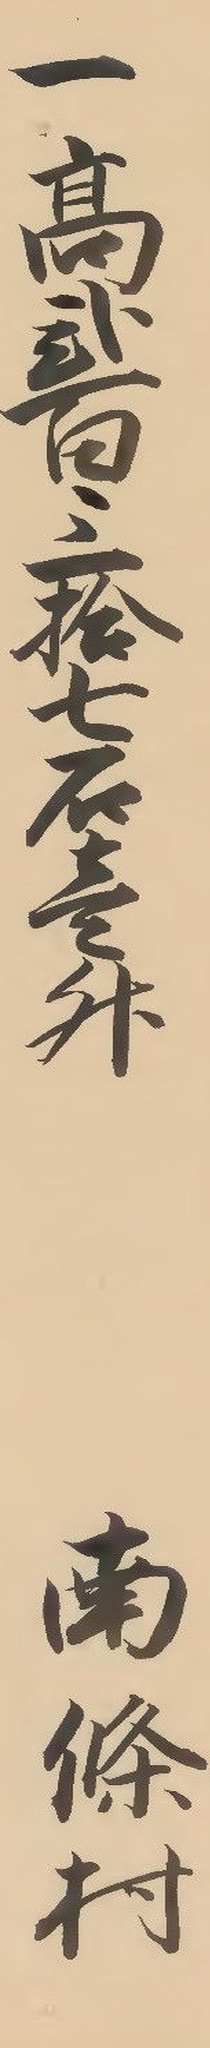一高弐百三拾七石壱升南条村
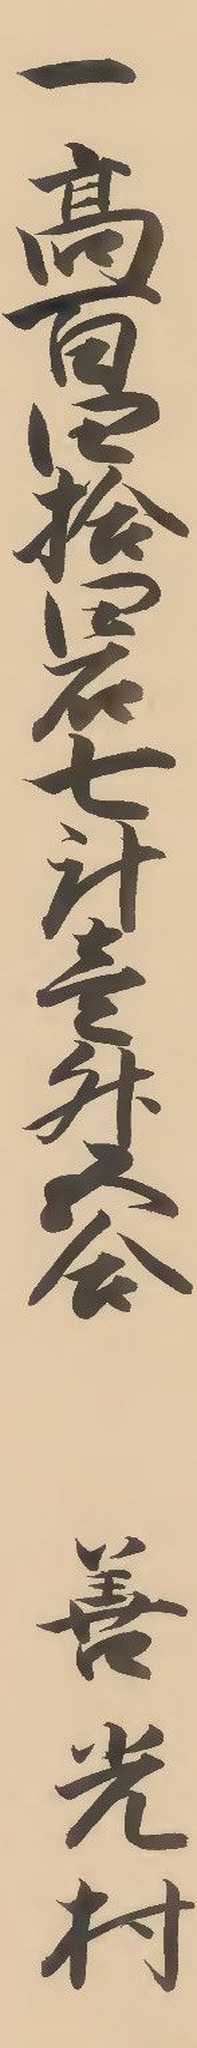一高百四拾四石七斗壱升五合善光村
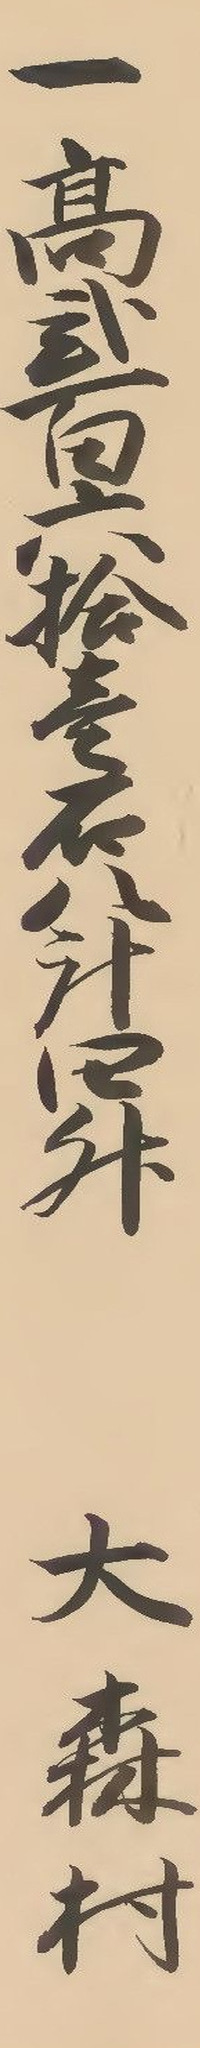一高弐百六拾壱石八斗四升大森村
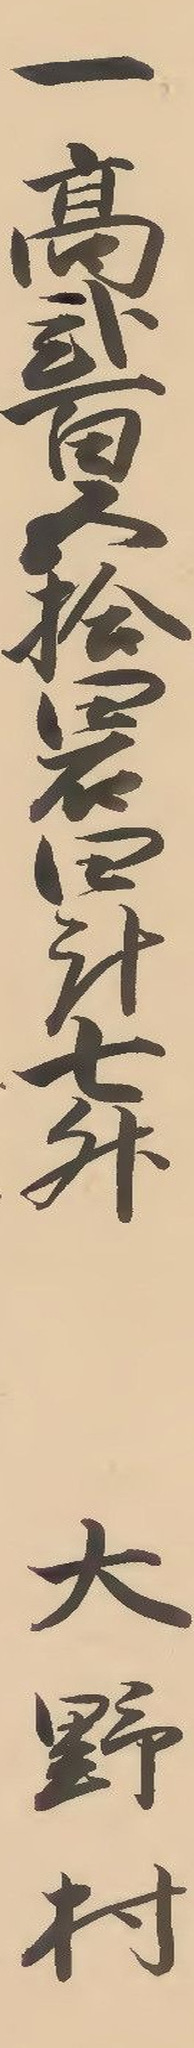一高弐百五拾四石四斗七升大野村
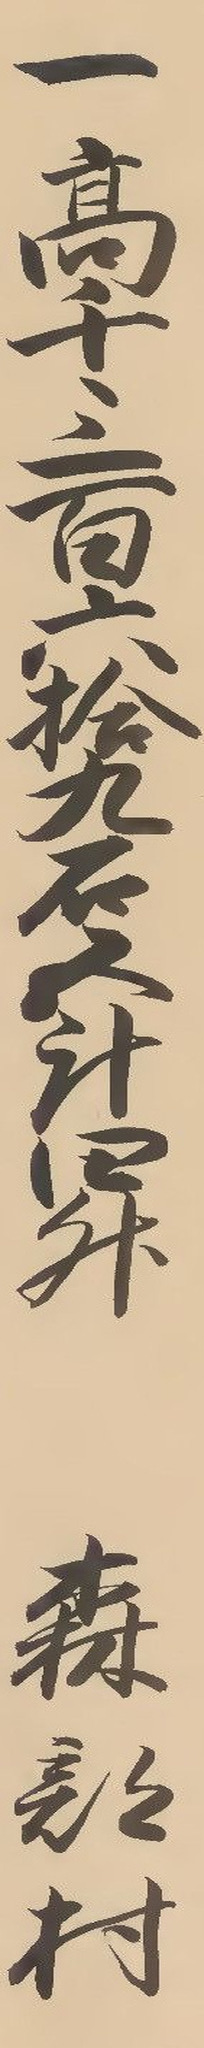一高千三百六拾九石五斗四升森部村
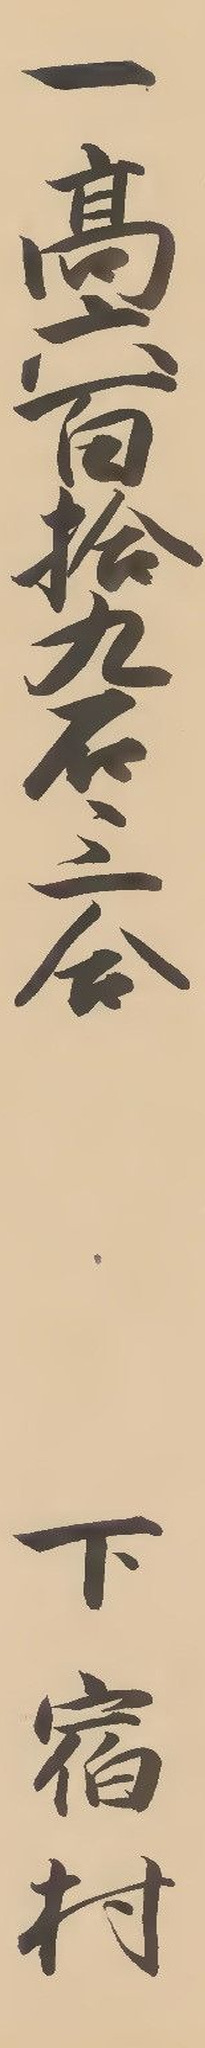一高六百拾九石三合下宿村
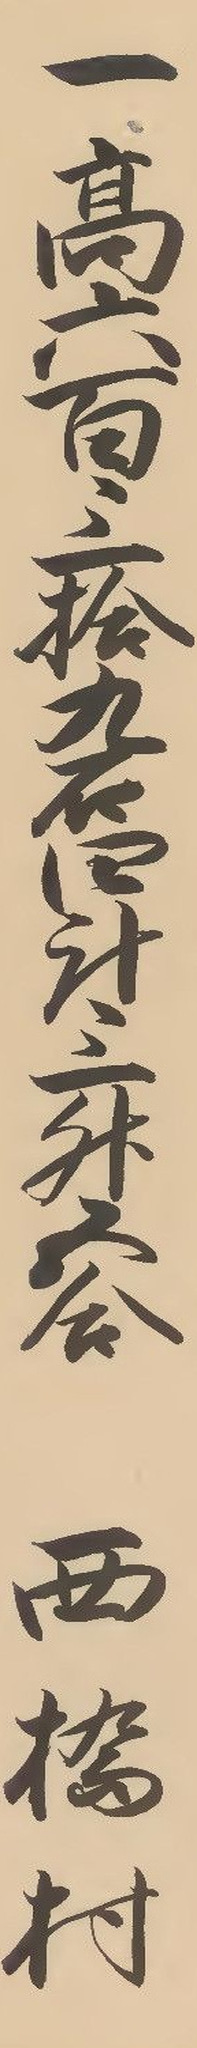一高六百三拾九石四斗三升五合西橋村

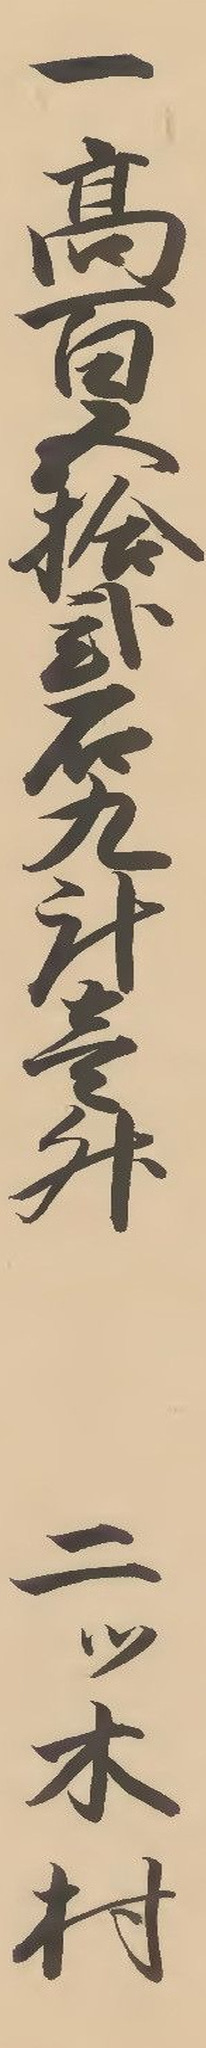一高百五拾弐石九斗壱升二ツ木村
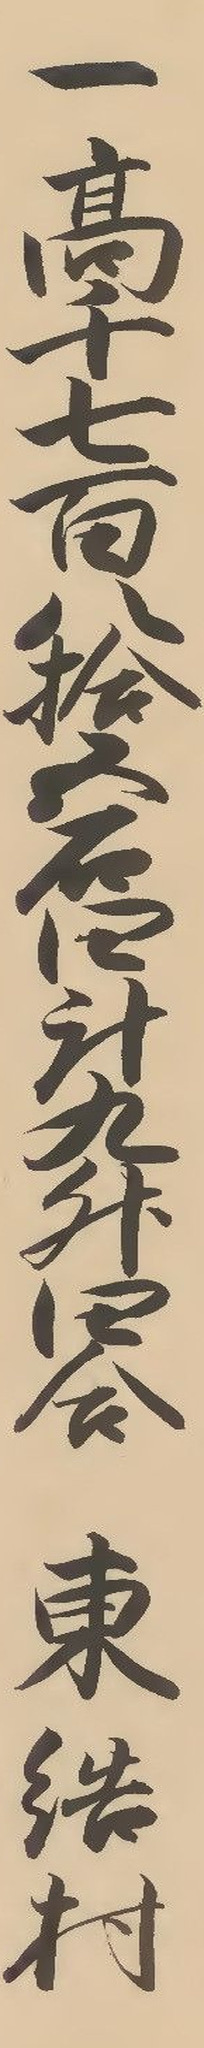一高千七百八拾五石四斗九升四合東結村
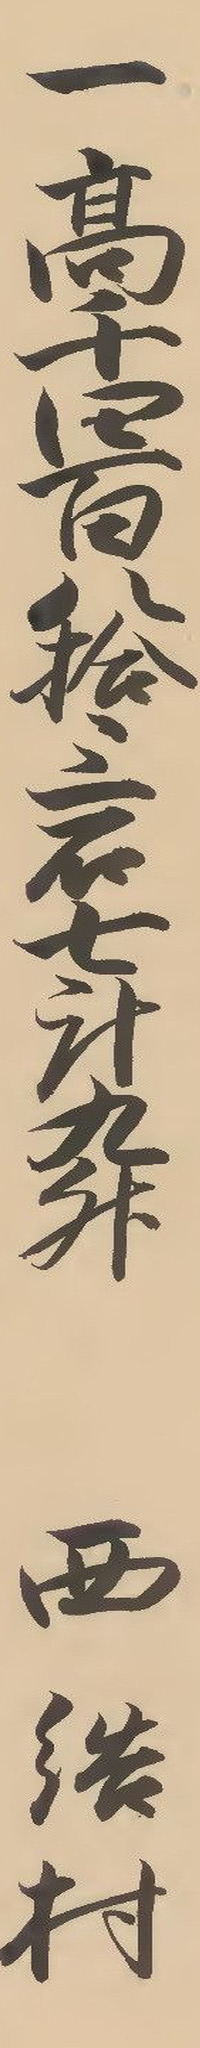一高千四百八拾三石七斗九升西結村
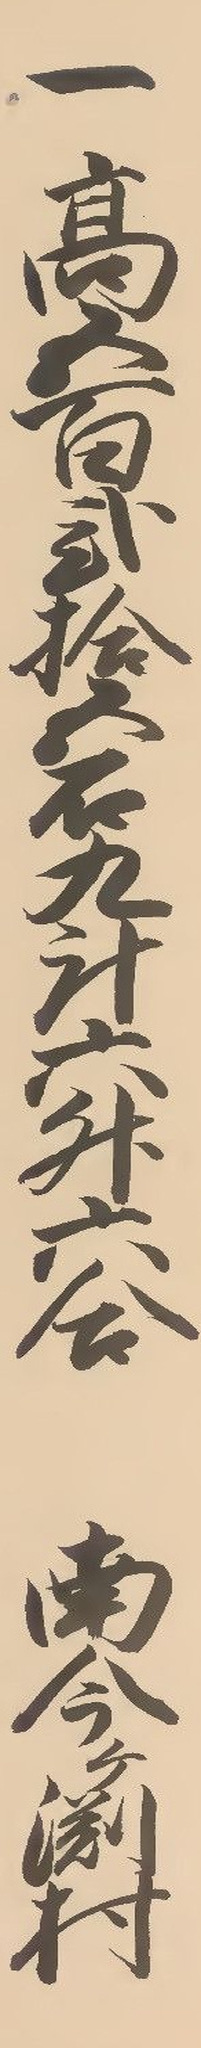一高五百弐拾五石九斗六升六合南今ヶ渕村
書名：美濃国郷帳
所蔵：国立公文書館 National Archives of Japan
